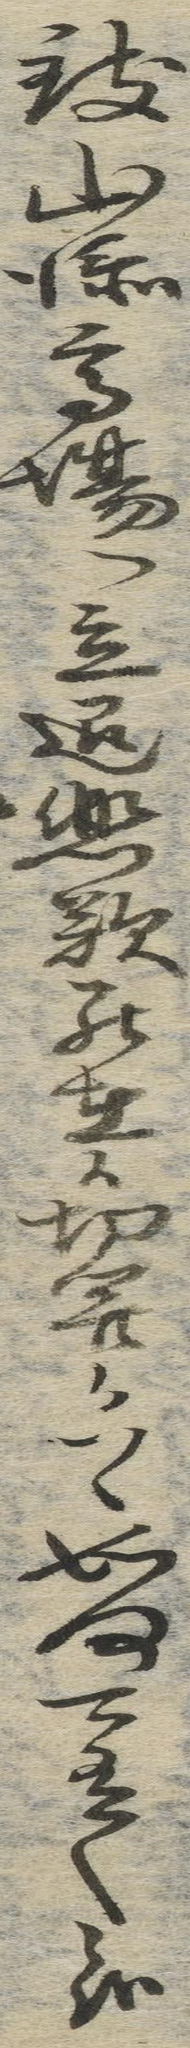致山添高場へ立退悲歎罷在候切候ハゝ如何可有之候哉
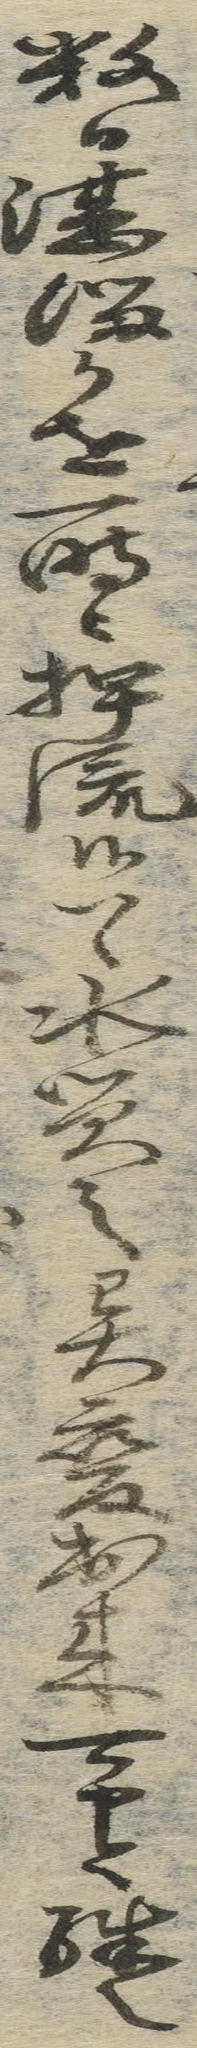数日湛留候を一時二押流候ハゝ水災之異変出来可申と殊之
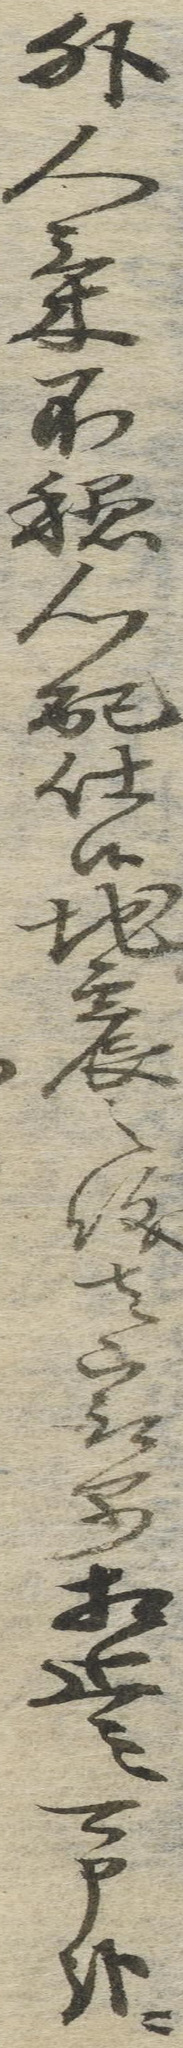外人気不穏心配仕候地震之儀は最早相止ミ可申哉二
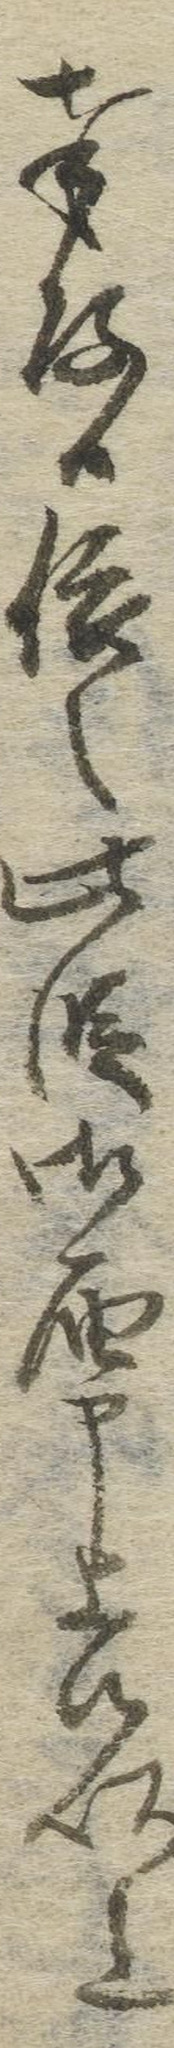奉存候依之此段御届申上候以上
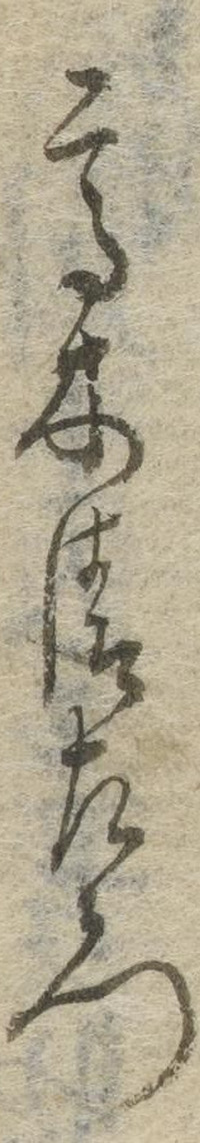高木清左衛門
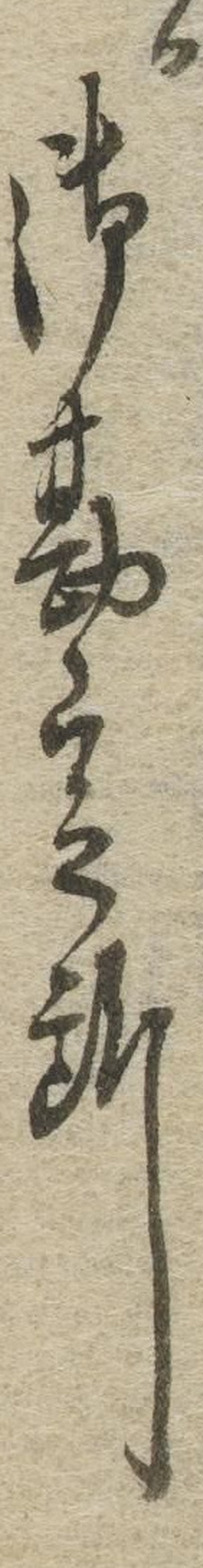御勘定所

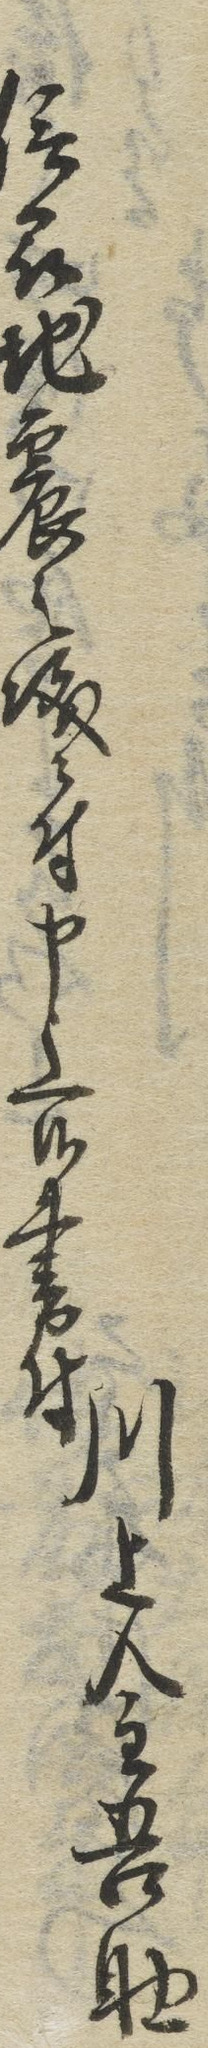信州地震之儀二付申上候書付川上金吾助
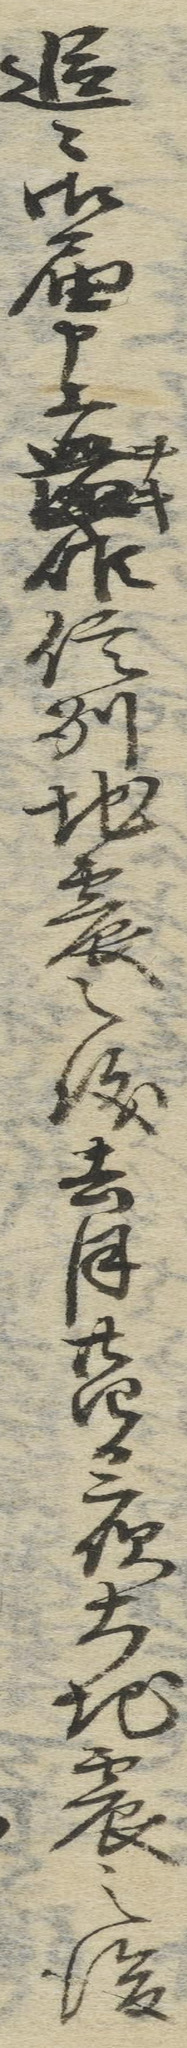追々御届申上置候信州地震之儀去月廿四日夜大地震之後
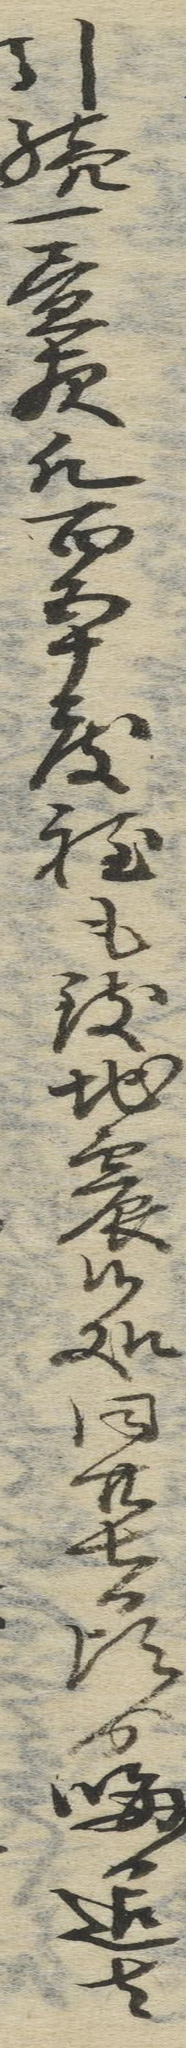引続一昼夜凡百五十度程も致地震候処同廿七日頃ゟ晦日迄は
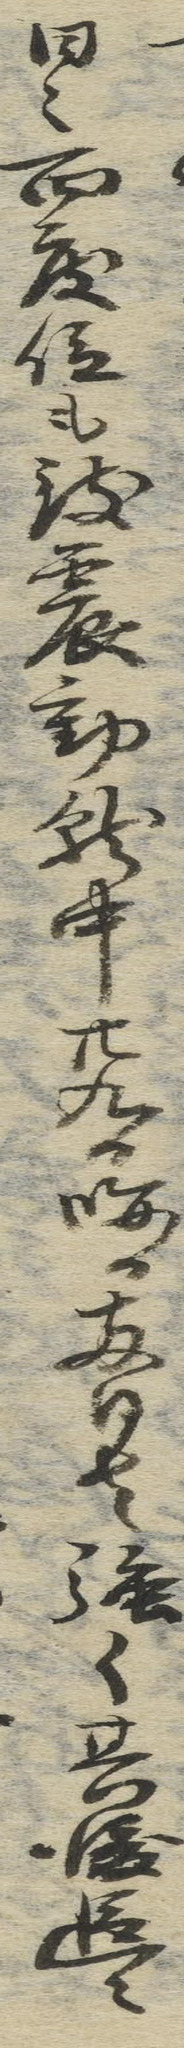日々百度位も致震動就中廿九日晦日両日は強其後追々
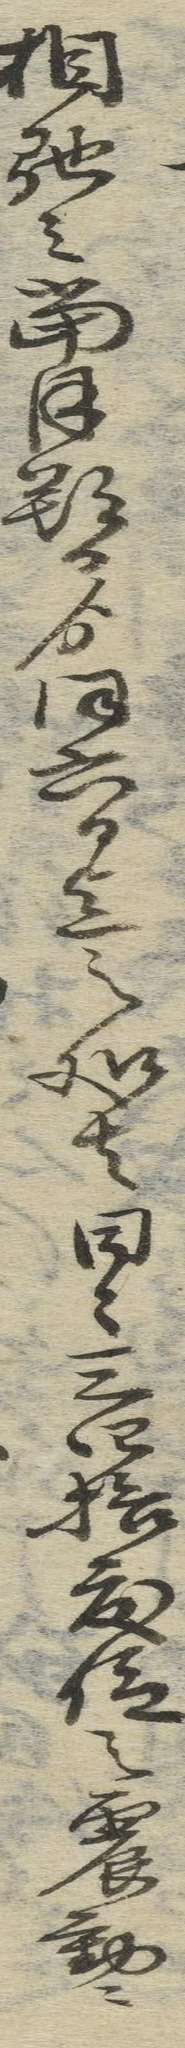相弛ミ当月朔日ゟ同六日迄之処は日々三四拾度位之震動二
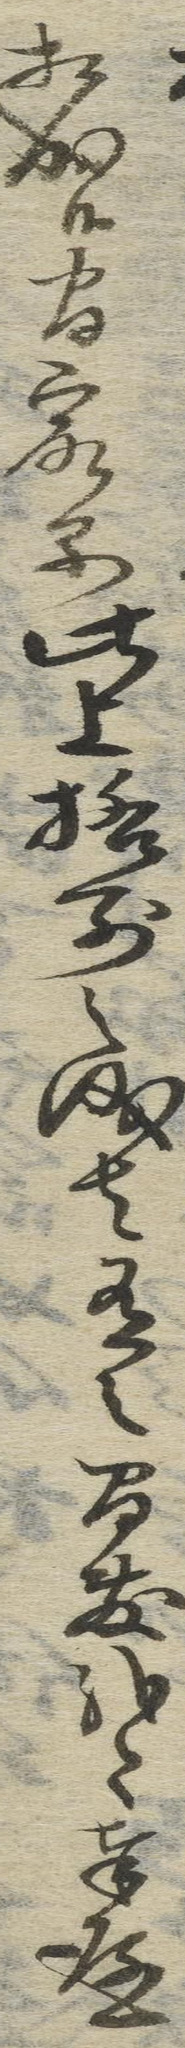相成候間最早此上格別之儀は有之間敷哉二奉存候
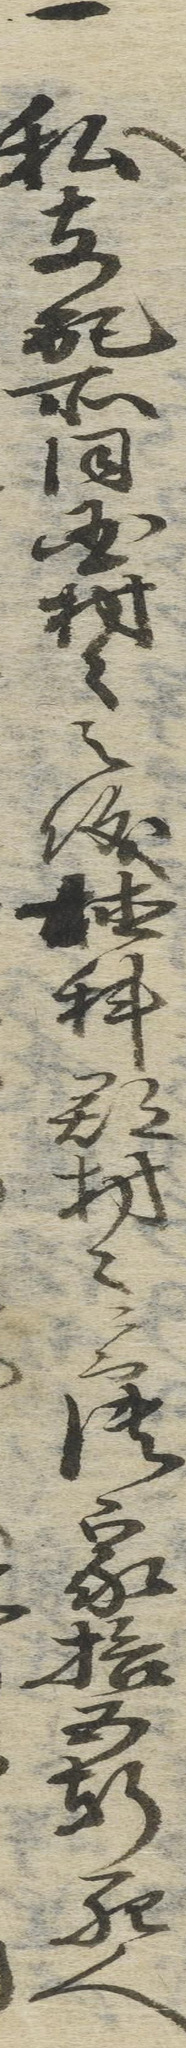一私支配所同国村々之儀埴科郡村々二而潰家拾五軒死人
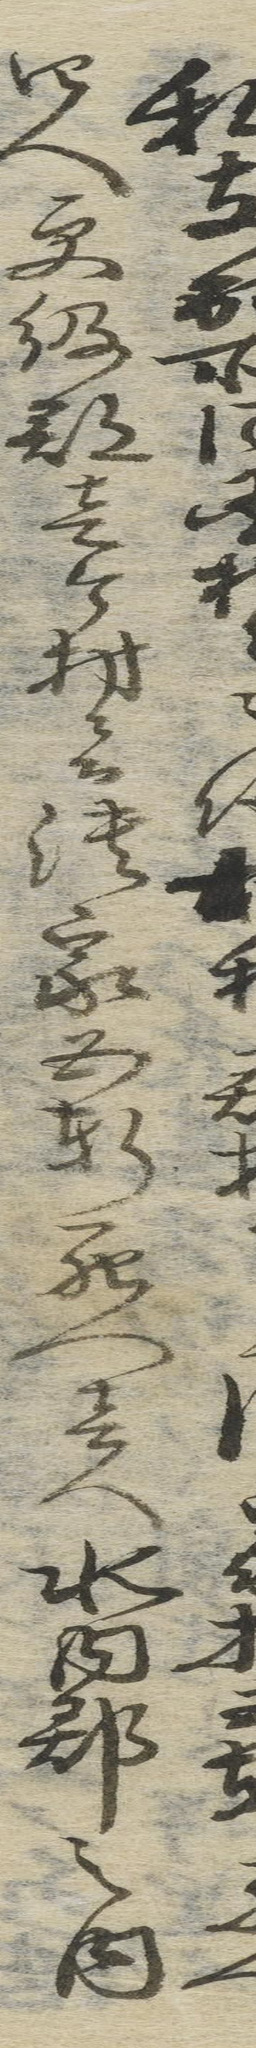四人更級郡壱ヶ村二而潰家五軒死人壱人水内郡之内
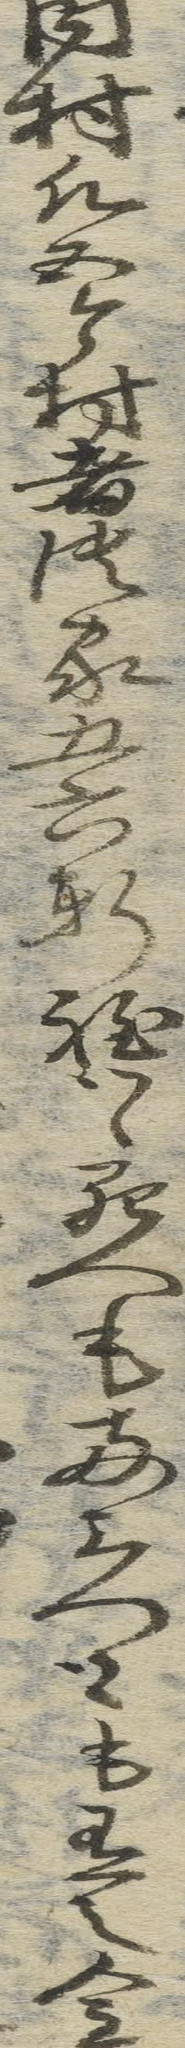同村凡五ヶ村は潰家五六軒程ツゝ死人も両三人ツゝも有之金
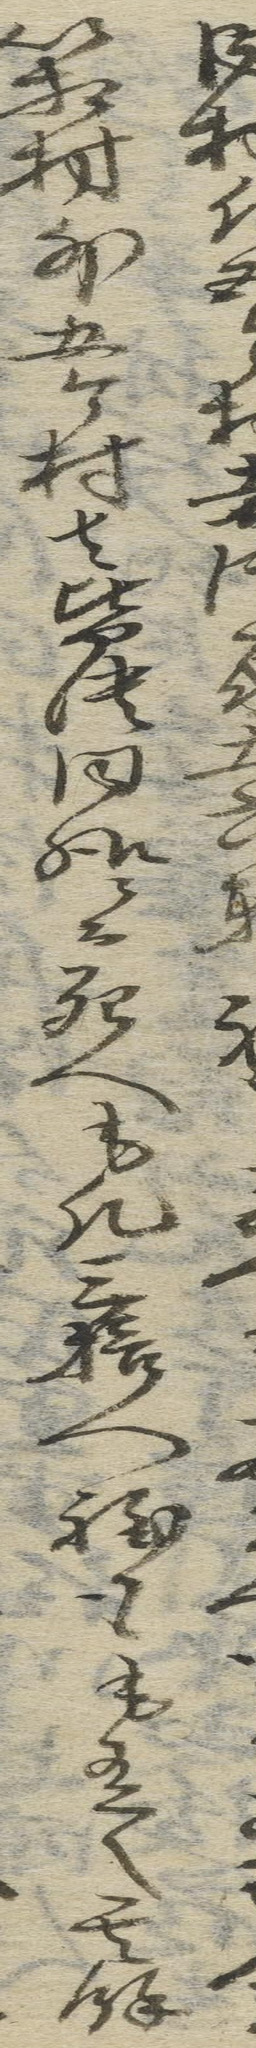箱村外五ヶ村は皆潰同様二而死人も凡三拾人ッ程ゝも有之其餘
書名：信濃越後　地震書留
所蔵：東京大学地震研究所図書室 Earthquake Research Institute Library, The University of Tokyo, JAPAN
